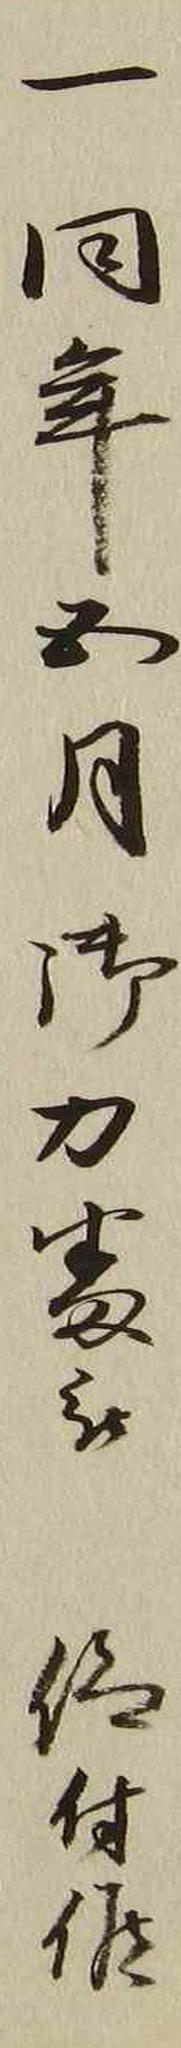一同年五月御刀番被仰付候
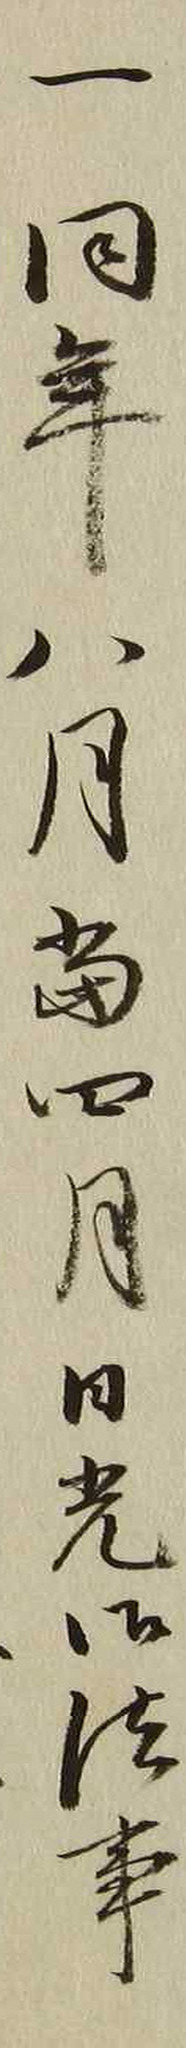一同年八月当四月日光御法事
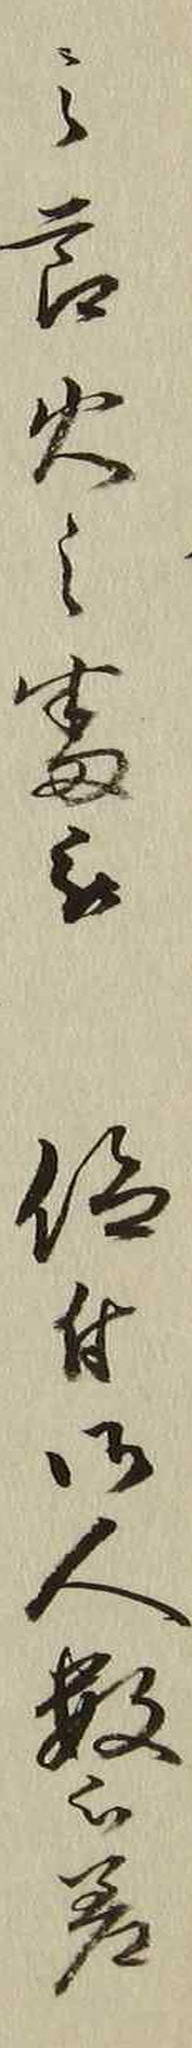之節火之番被仰付御人数被差
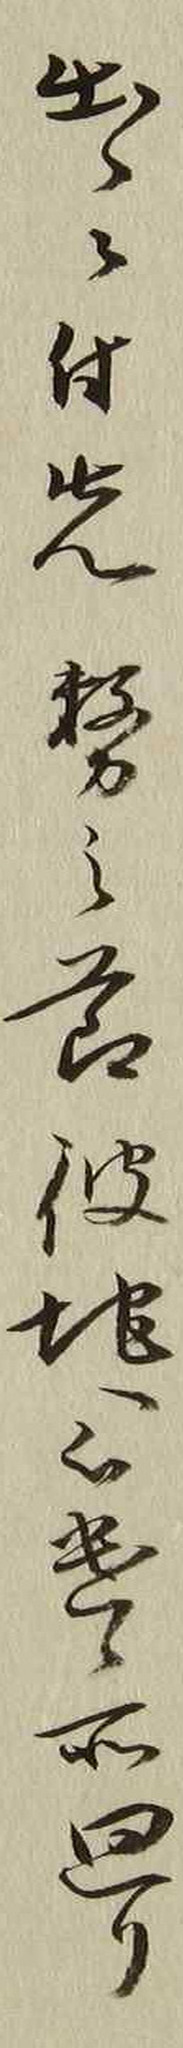出候ニ付先務之節彼地へ被遣候所廻り
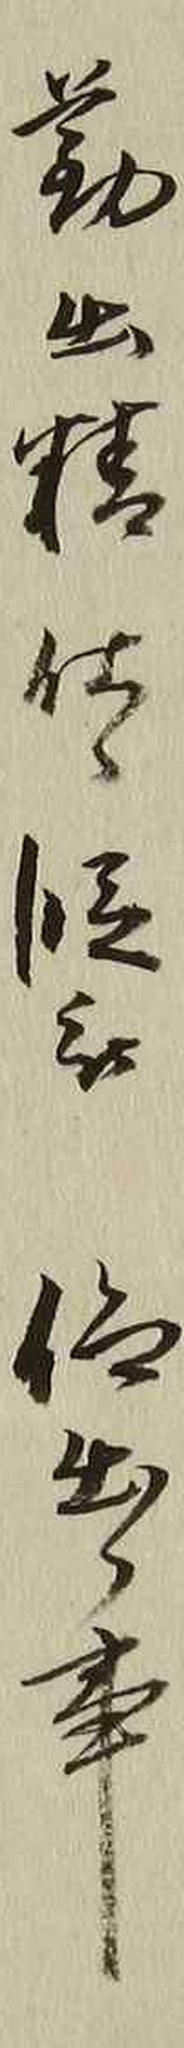勤出精仕候段被仰出候事
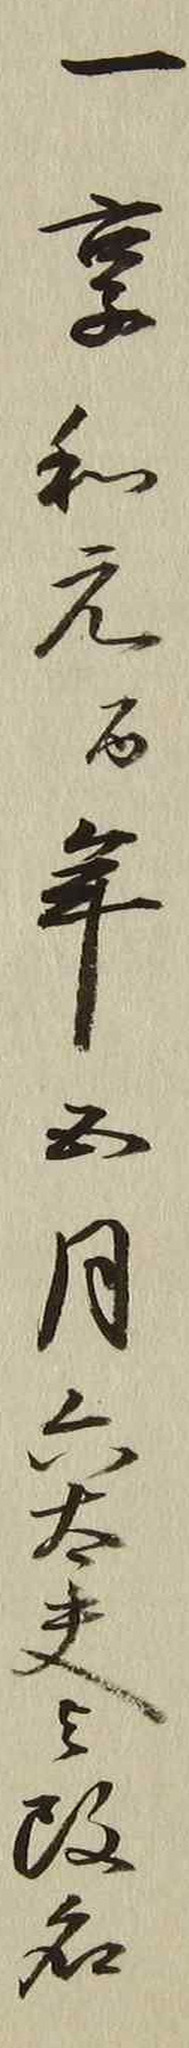一享和元酉年五月六太夫与改名
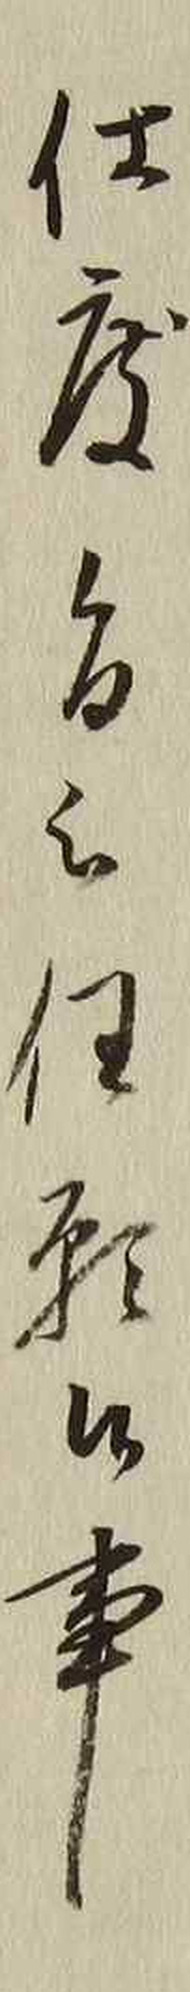仕度旨被任願候事
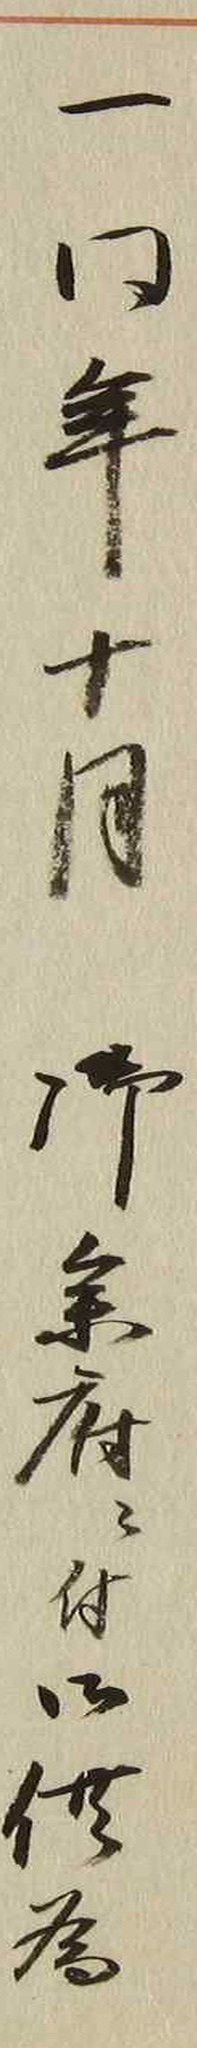一同年十月御参府ニ付御供為
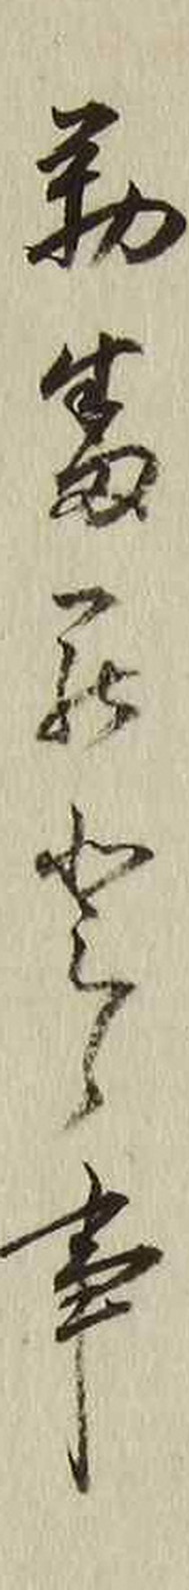勤番罷登候事
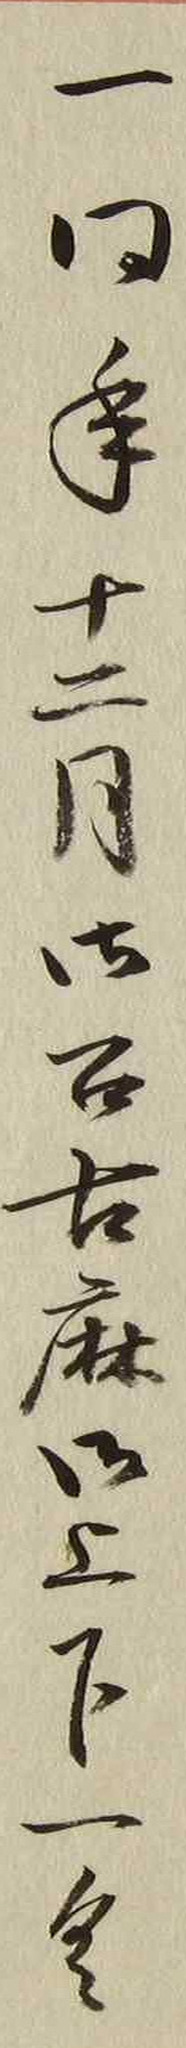一同年十二月御召古麻御上下一具
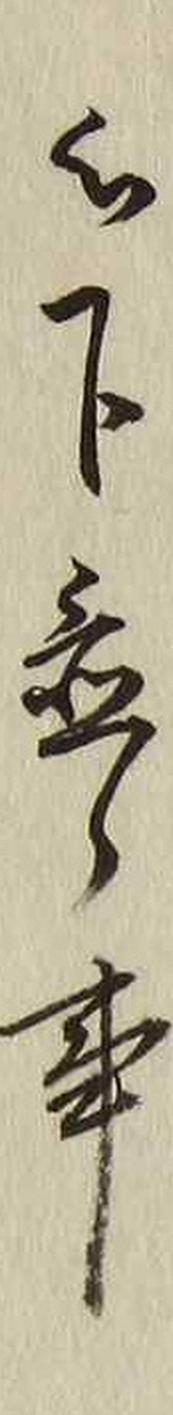被下置候事
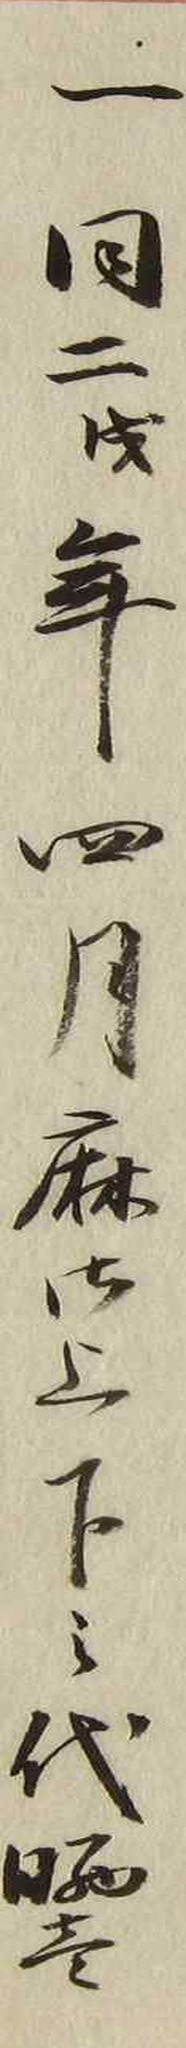一同二戌年四月麻御上下之代晒壱
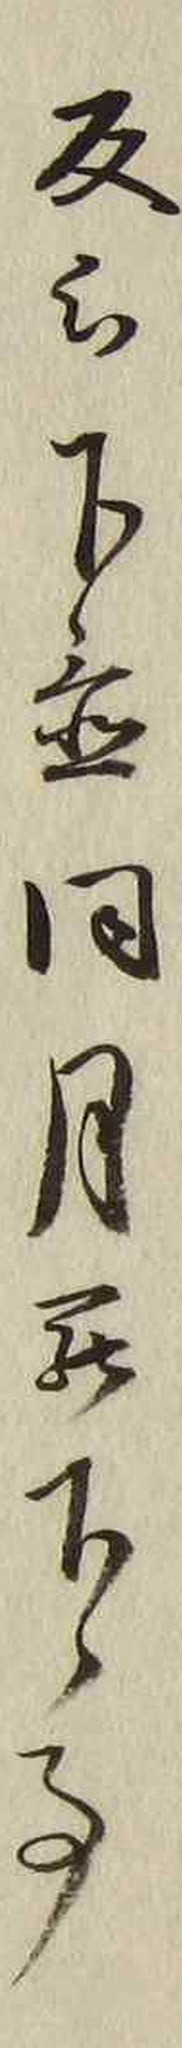反被下置同月罷下候事
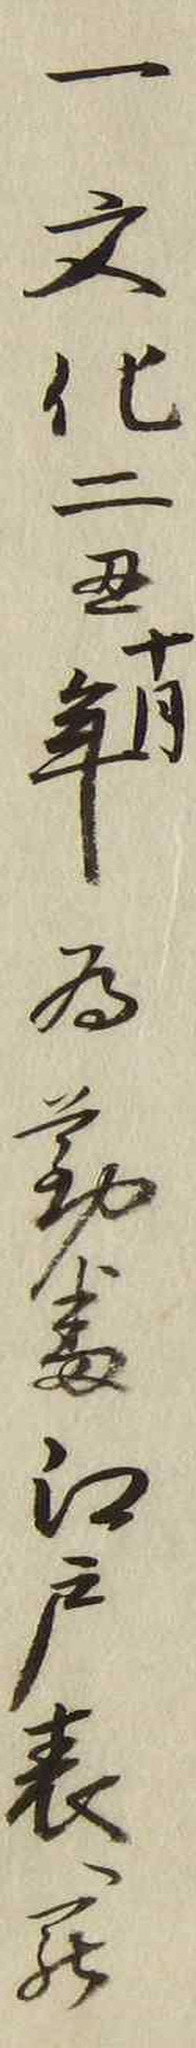一文化二丑年十月為勤番江戸表へ罷
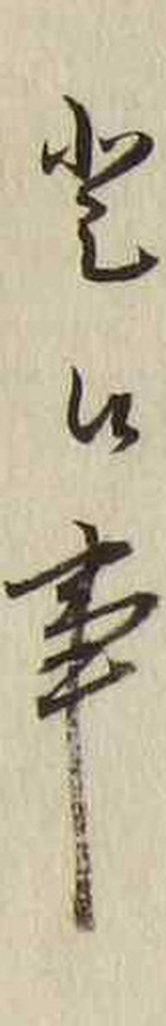登候事

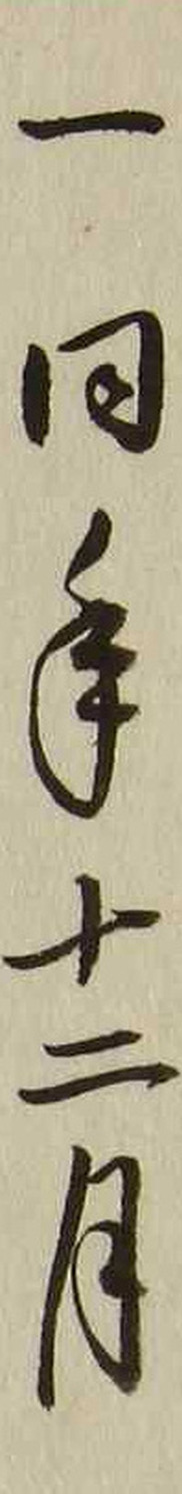一同年十二月
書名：諸士系譜　巻之69　を之部3
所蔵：会津若松市立会津図書館
